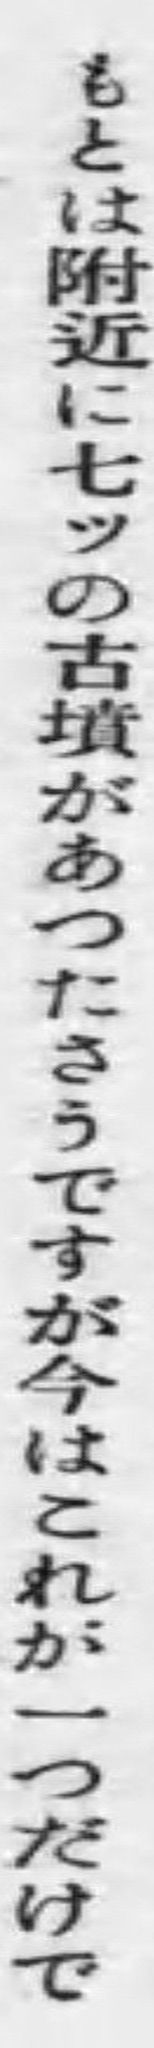もとは附近に七ツの古墳があつたさうですが今はこれが一つだけで
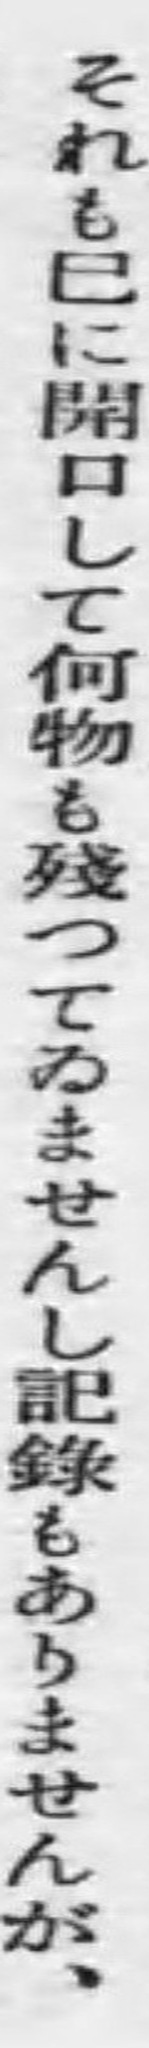それも巳に開口して何物も残つてゐませんし記録もありませんが、
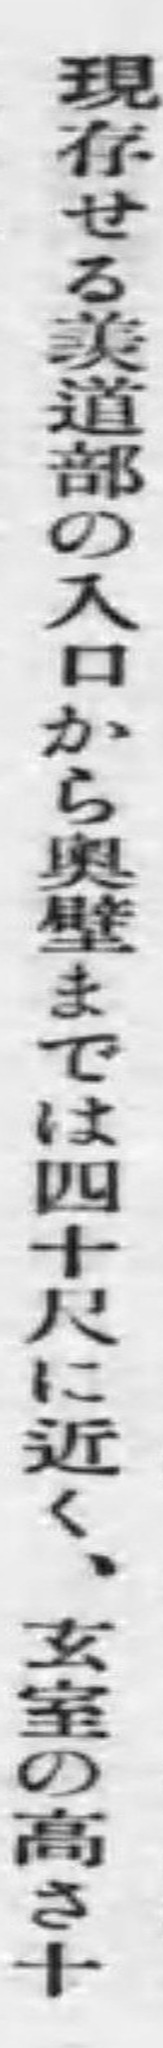現存せる羨道部の入口から奥壁までは四十尺に近く、玄室の高さ十
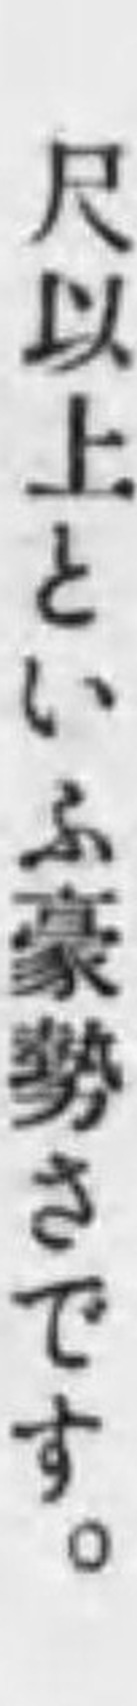尺以上といふ豪勢さです。
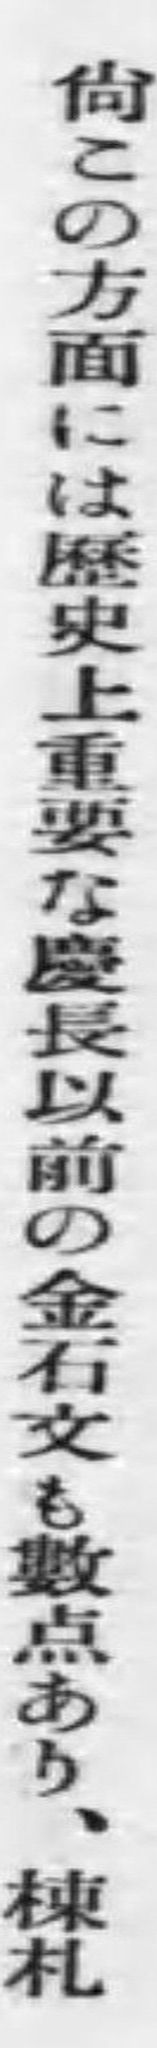尚この方面には歴史上重要な慶長以前の金石文も数点あり、棟札
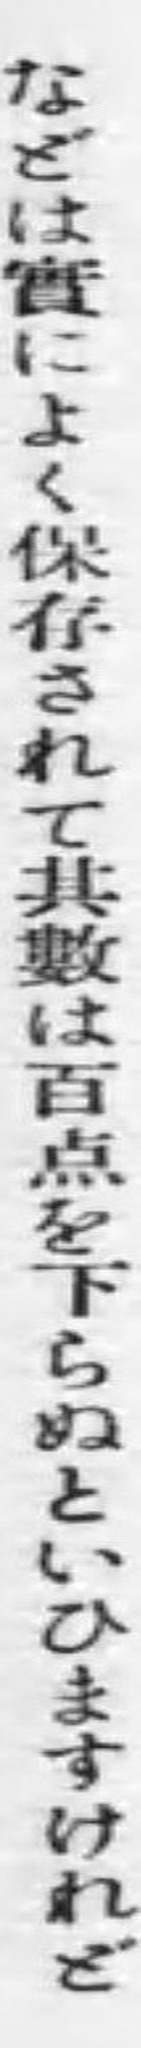などは実によく保存されて其数は百点を下らぬといひますけれど
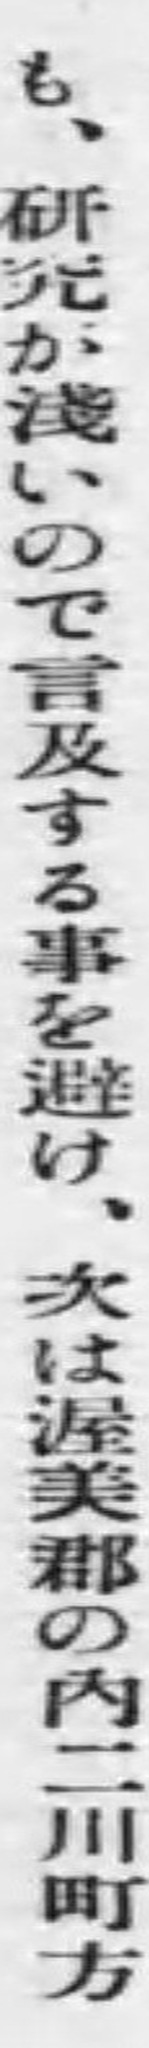も、研究が浅いので言及する事を避け、次は渥美郡の内二川町方
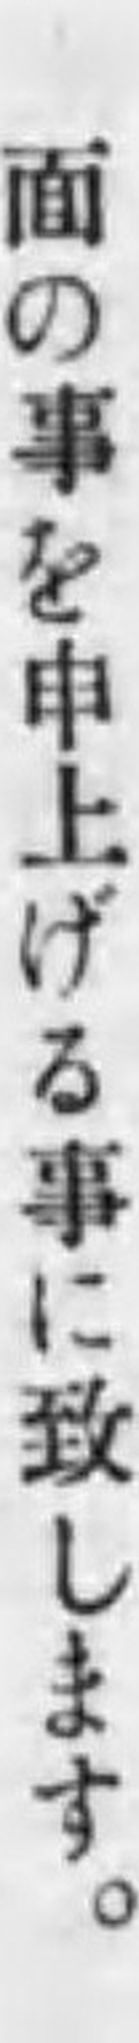面の事を申上げる事に致します。
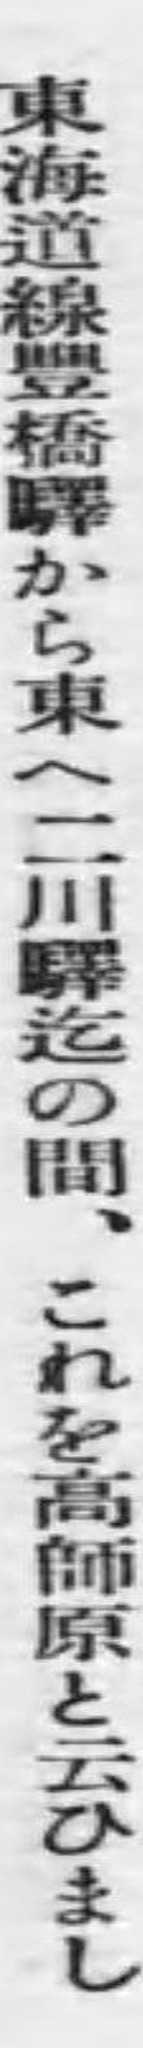東海道線豊橋駅から東へ二川駅迄の間、これを高師原と云ひまし
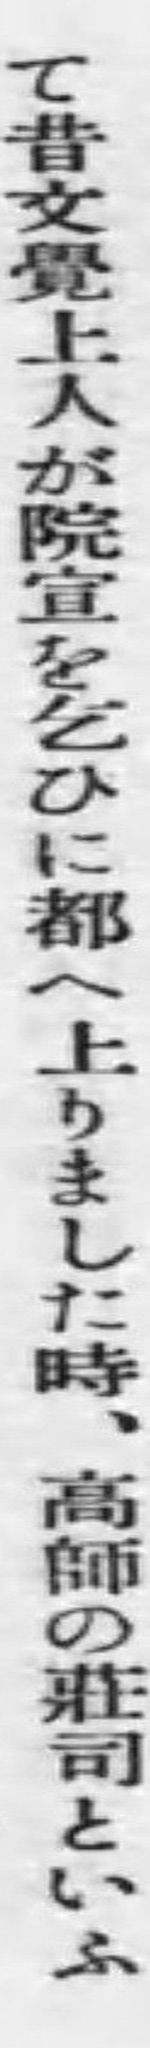て昔文覚上人が院宣を乞ひに都へ上りました時、高師の荘司といふ
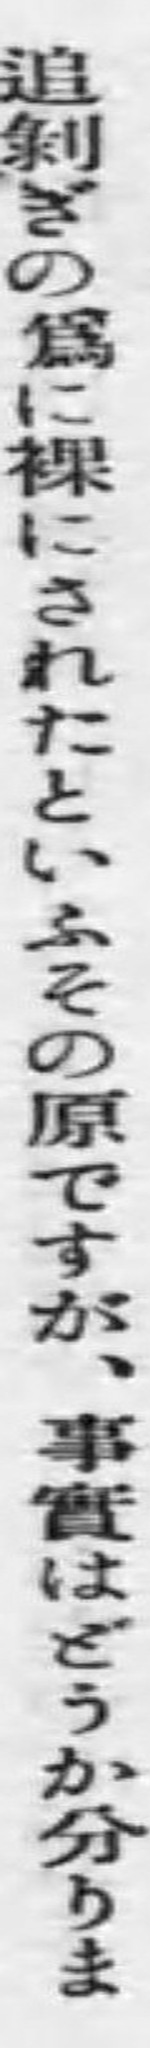追剥ぎの為に裸にされたといふその原ですが、事実はどうか分りま
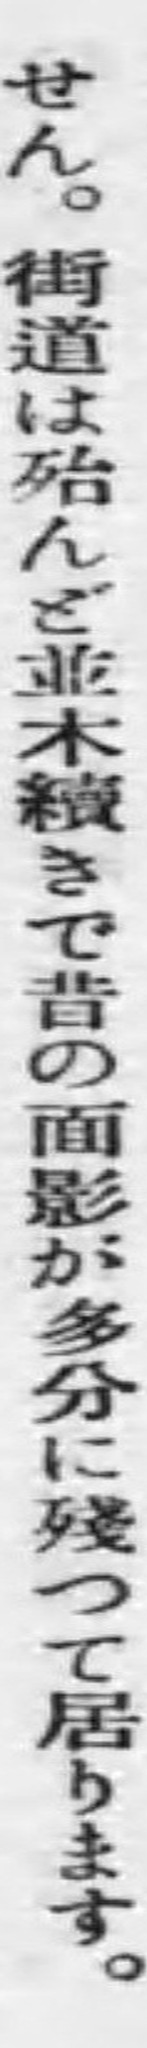せん。街道は殆んど並木続きで昔の面影が多分に残つて居ります。
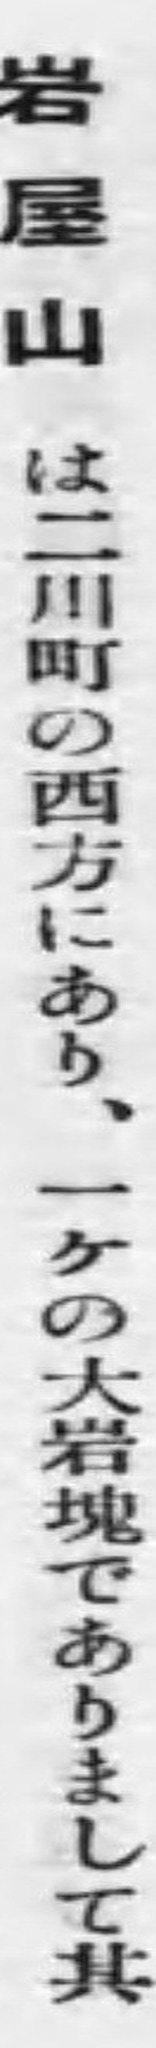岩屋山は二川町の西方にあり、一ヶの大岩塊でありまして其
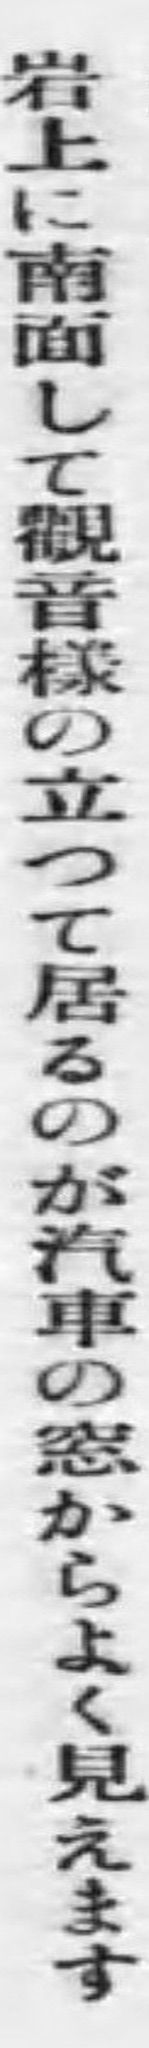岩上に南面して観音様の立つて居るのが汽車の窓からよく見えます
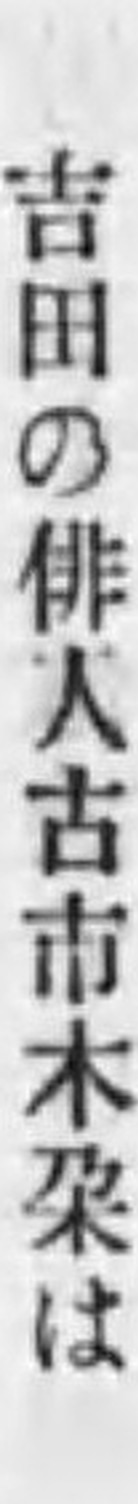吉田の俳人古市木朶は
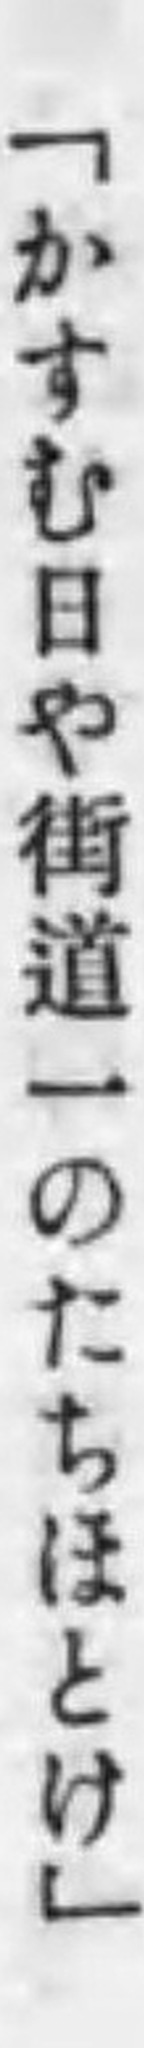「かすむ日や街道一のたちほとけ」
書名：東三河道中記 : 豊橋市及其附近案内
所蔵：国立国会図書館 National Diet Library, JAPAN
